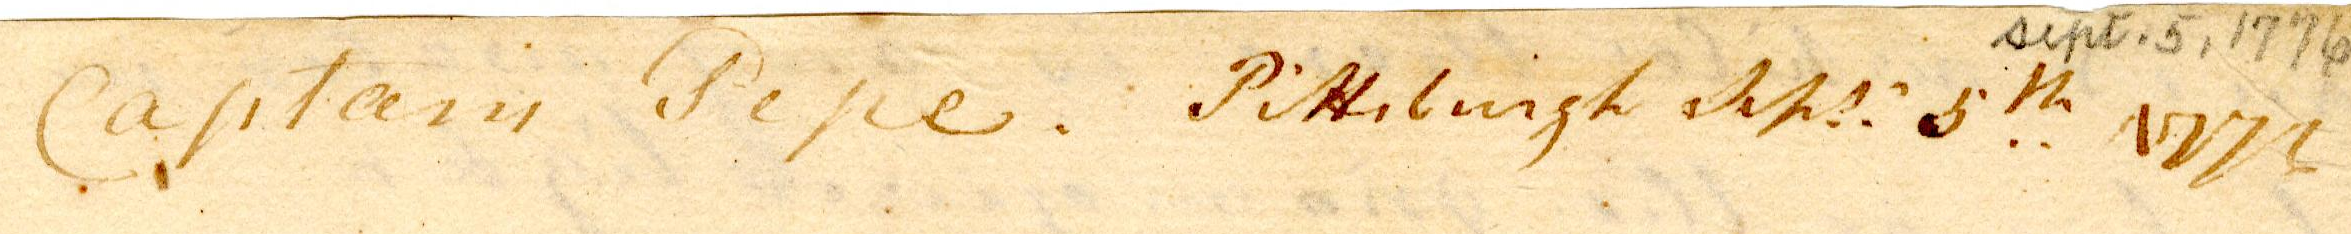Captain Pipe. Pittsburgh Sept^r. 5^th. 1776
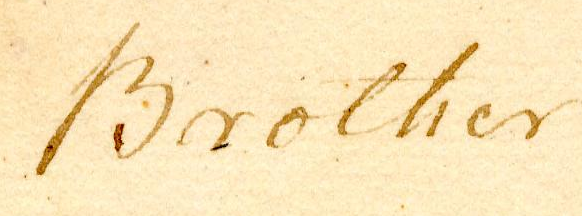Brother
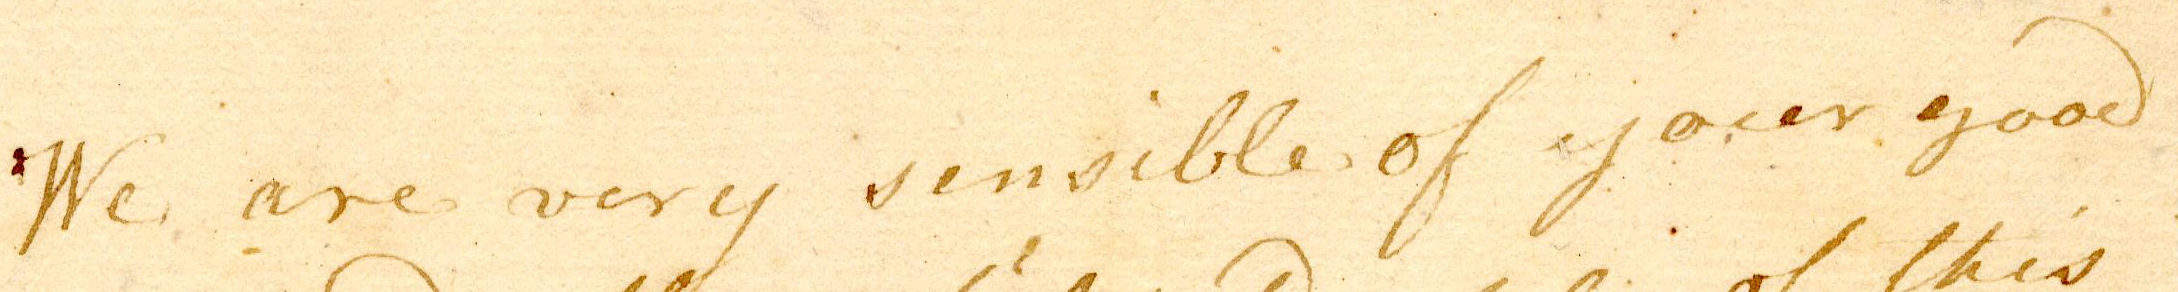We are very sensible of your good
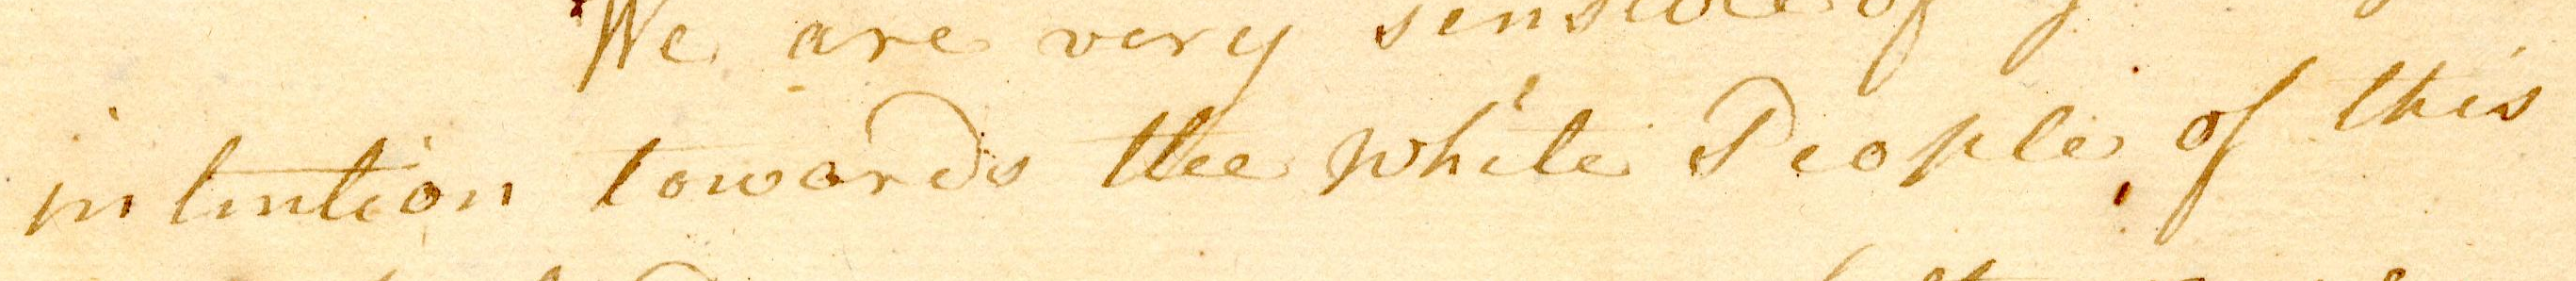intention towards the white People of this
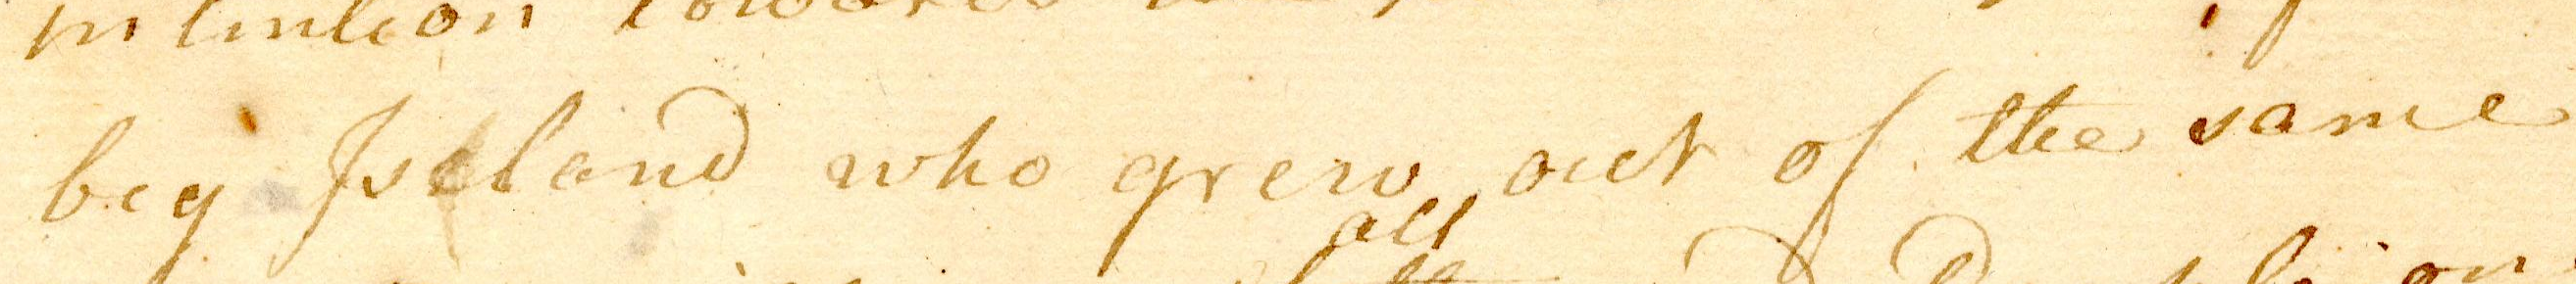big Island who grew out of the same
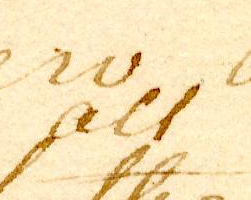all
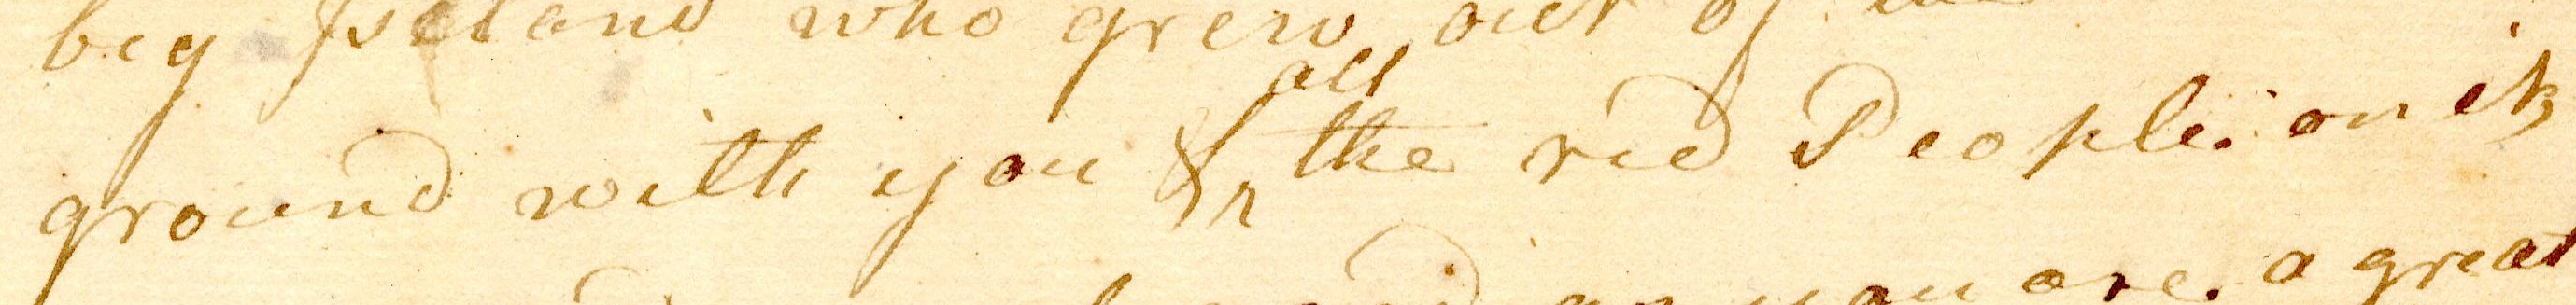ground with you & ^all the red People on it,
